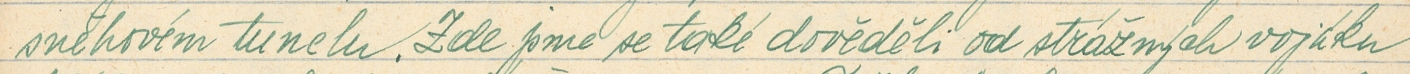sněhovém tunelu. Zde jsme se také dověděli od strážných vojáku
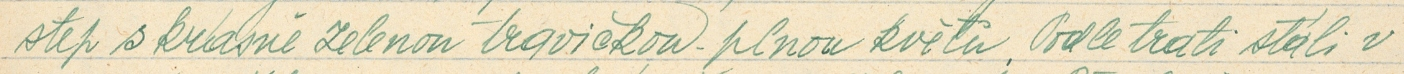step s krásně zelenou travičkou plnou květů. Podle trati stáli v
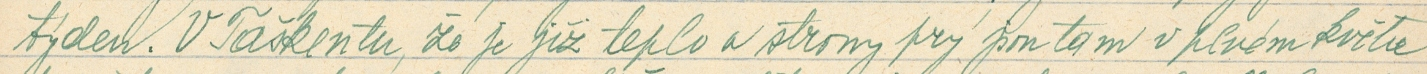týden. V Taškentu, že je již teplo a stromy prý jsou tam v plném květu
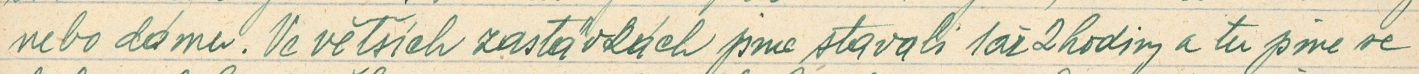nebo dámu. Ve větších zastávkách jsme stavali 1 až 2 hodiny a tu jsme se
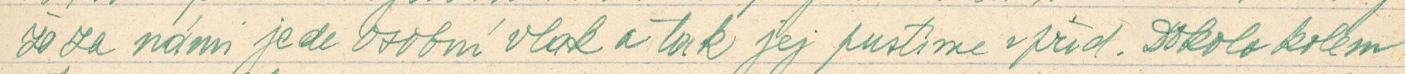že za námi jede osobní vlak a tak jej pustíme v před. Dokolo kolem
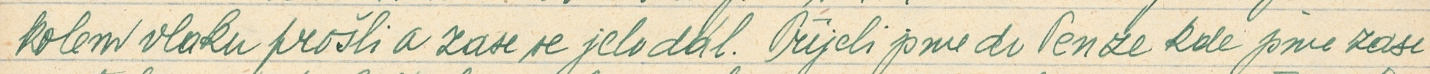kolem vlaku prošli a zase se jelo dál. Přijeli jsme do Penze kde jsme zase
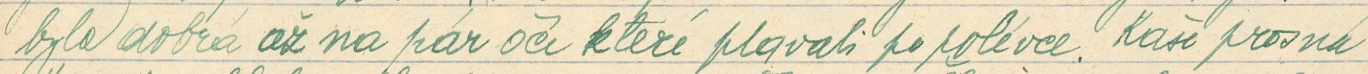byla dobrá až na pár očí které plavali po polévce. Kaše prosná.
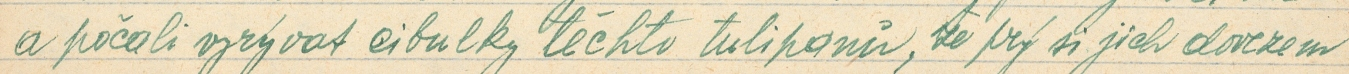a počali vyrývat cibulky těchto tulipanů, že prý si jich dovezem
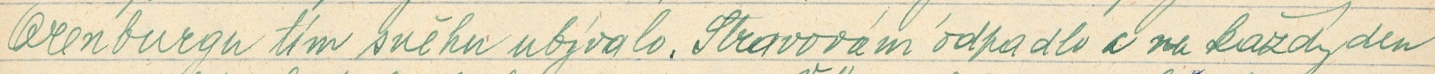Orenburgu tím sněhu ubývalo. Stravování odpadlo a na každý den
